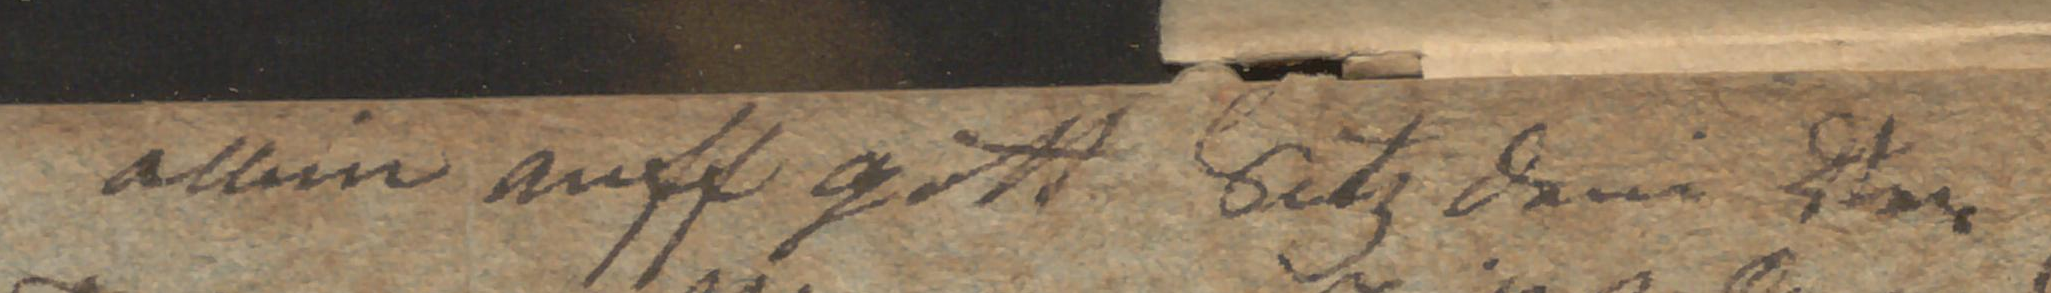allein auff gott setz dein Hon
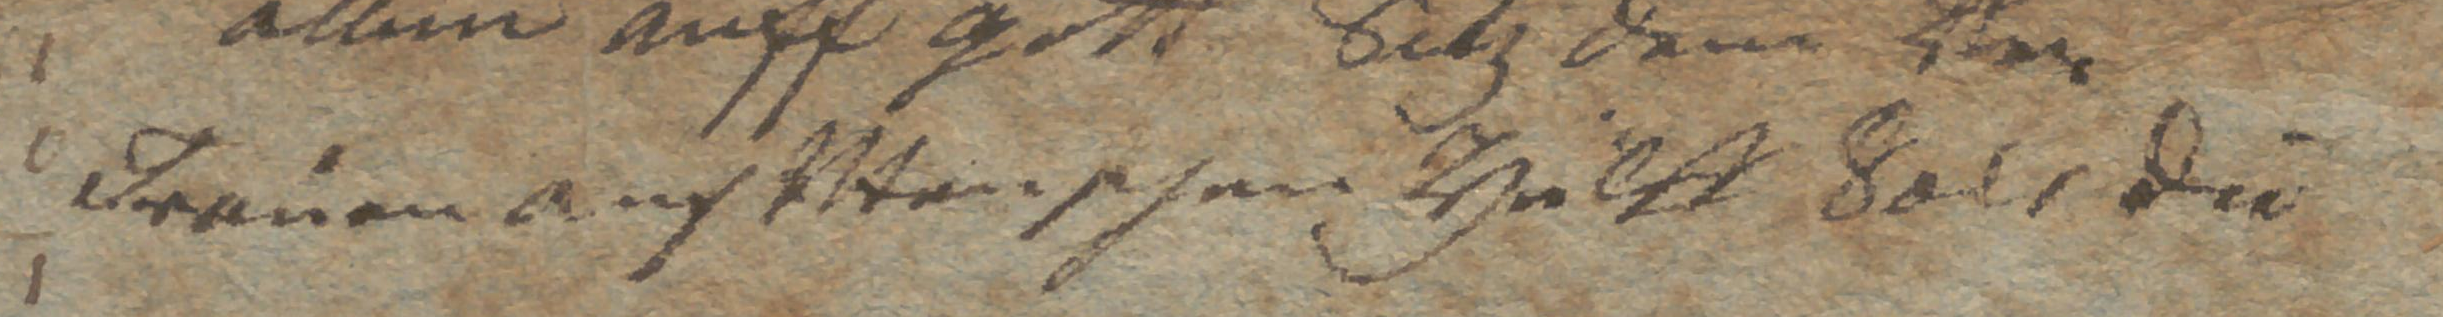Frannan a af Wan^ye^l. Gi^ls Vols did
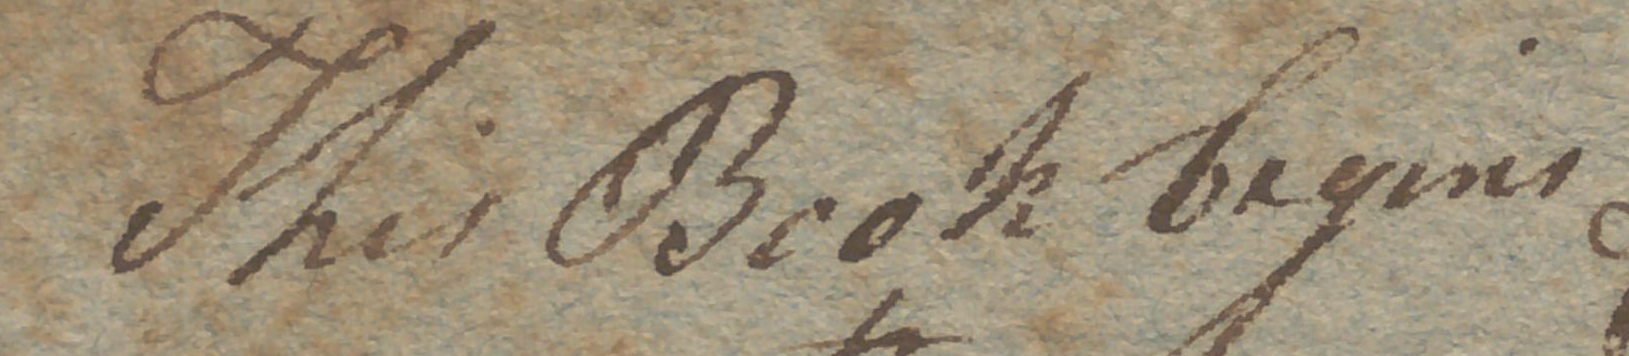This Book begins
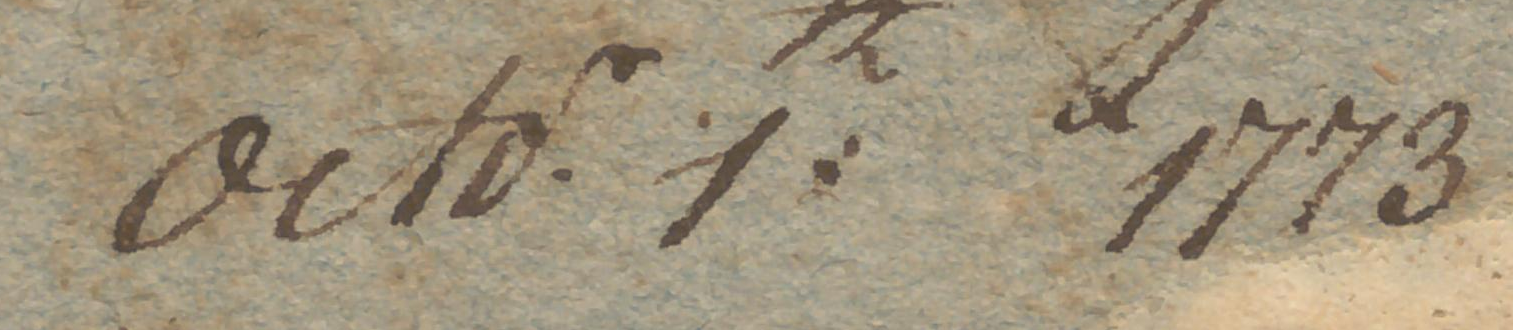Octo^r. 7^th. 1773
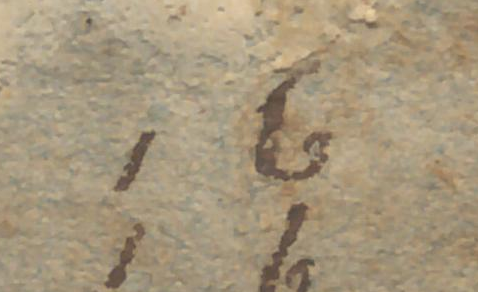16
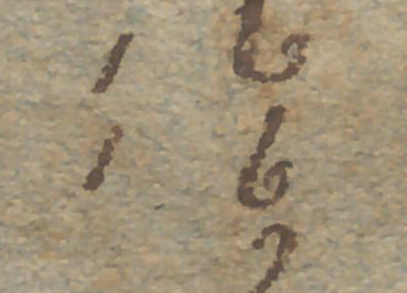16
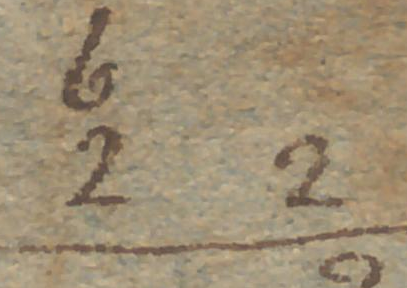22
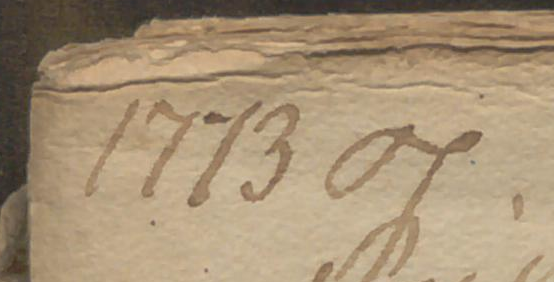177
